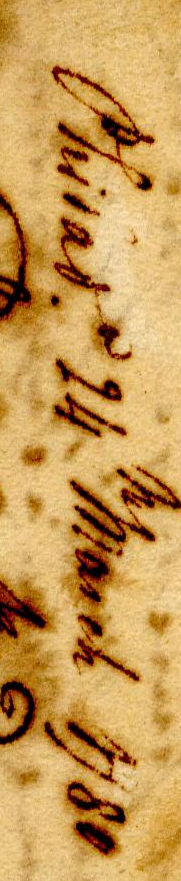Phiad^a. 24^th March 1780
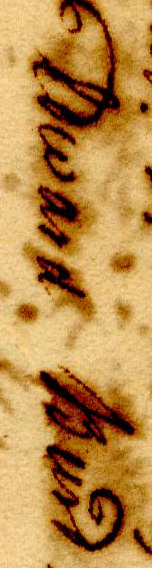Edward Bud.
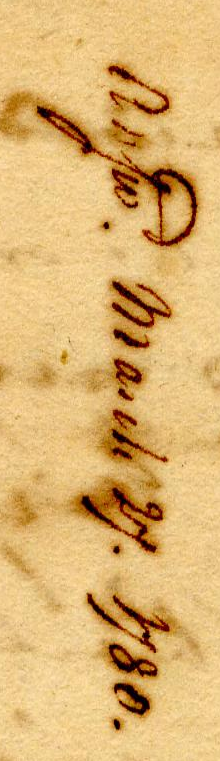Answ^d. March 27. 1780.
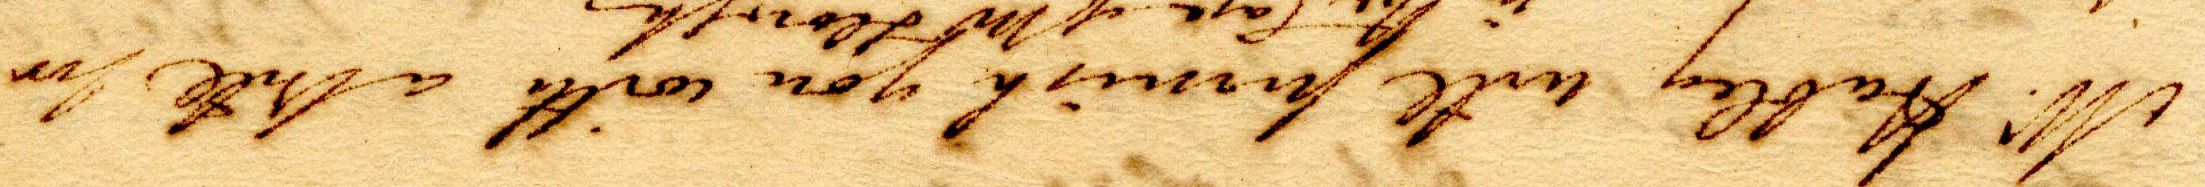M^r. Habley will furnish you with a shell for
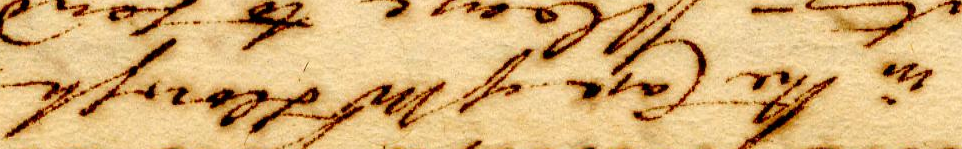in the Case of M^r Slough
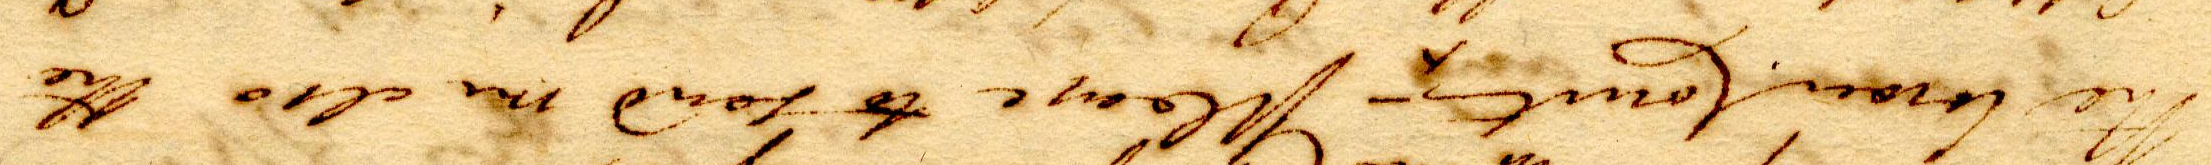the Corn Court. Please to send me also the
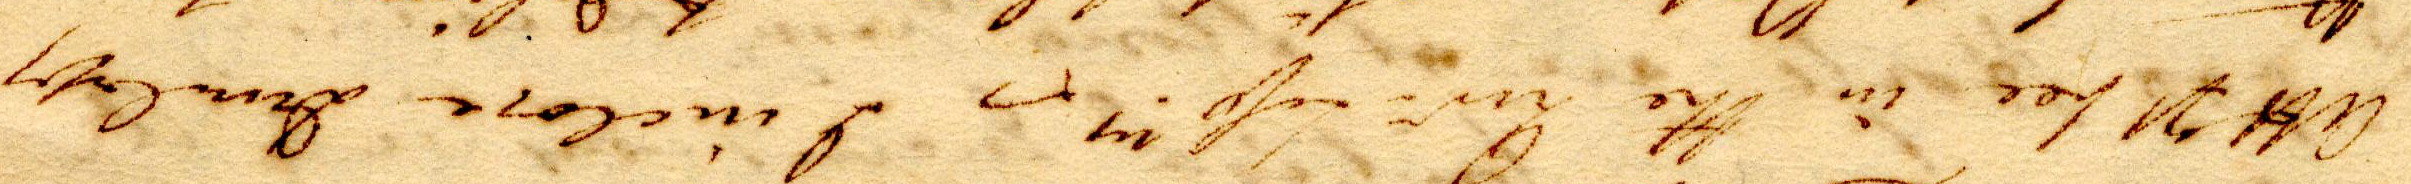Att V Lee in the Qur. Less^ny. I inclose Drum Copy
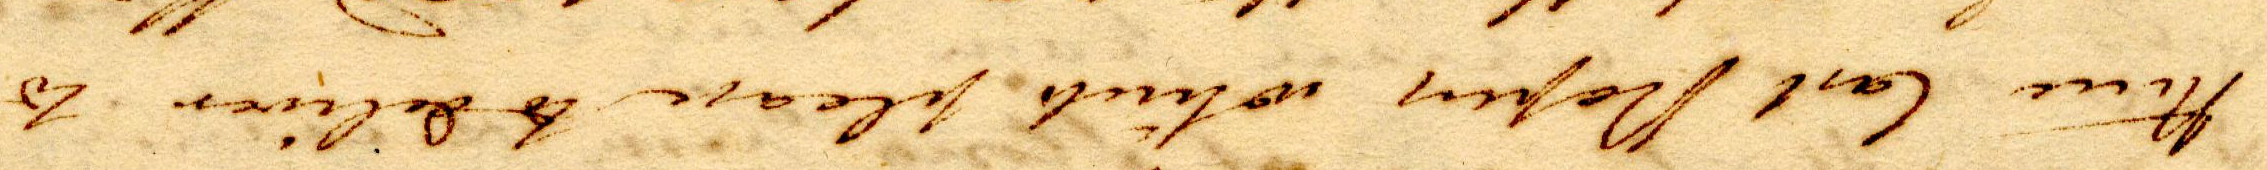there last Papers which please to deliver to
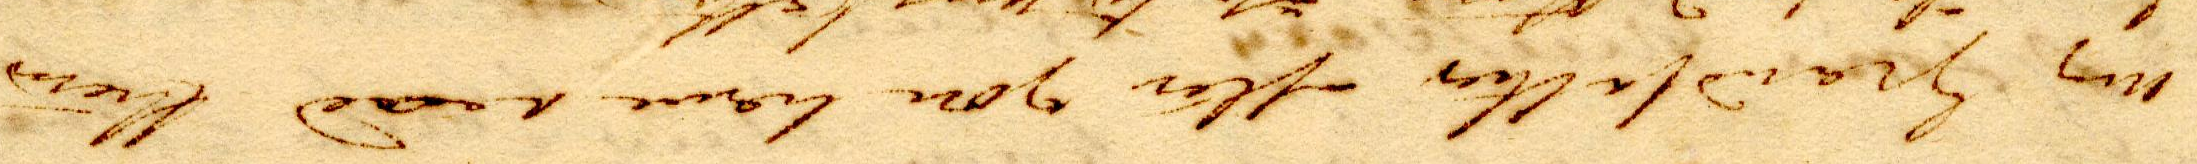my Grandfather after you have read them
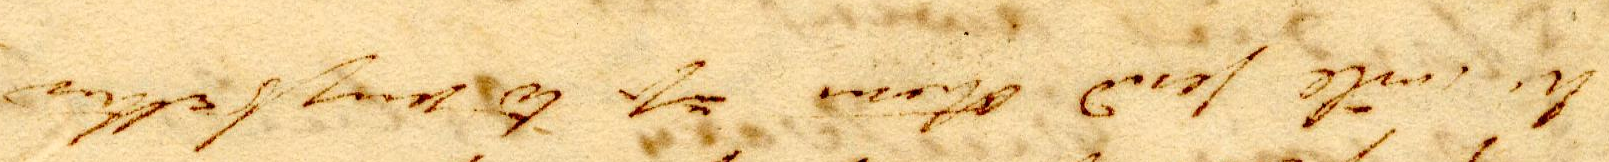he will send them up to my father
